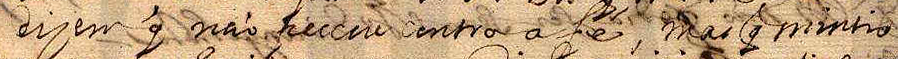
dizem q̄ naõ peccou contra a fé, mas q̄ mintio
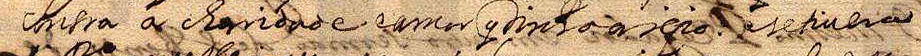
contra a charidade e amor q̄ tinha a xpo. e se tiuera
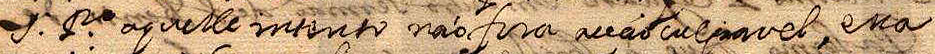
S. P.o aquelle intento naõ fora acçaõ culpavel, e na
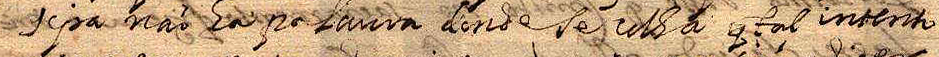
scp̄a naõ ha palaura donde se colha q̄ tal intento
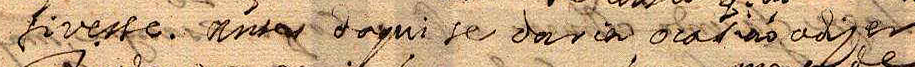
tivesse. antes daqui se daria ocasiaõ a dizer
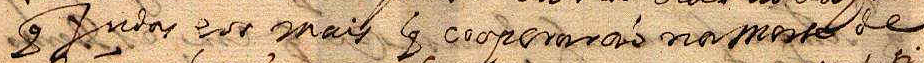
q̄ Judas e os mais q̄ cooperaraõ na morte de
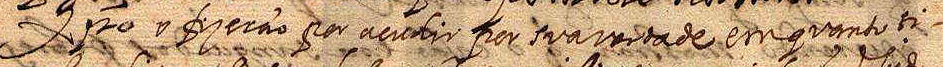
Xp̄o o fizeraõ por acudir por sua verdade em quanto ti
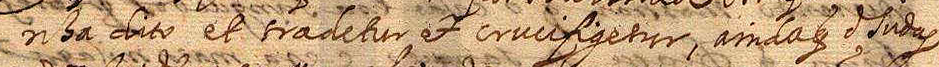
nha dito et tradetur et crucifigetur, ainda q̄ d Iudas
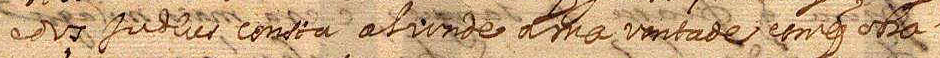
e dos Judeus consta ali unde a ma vontade com q̄ obra
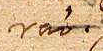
raõ.
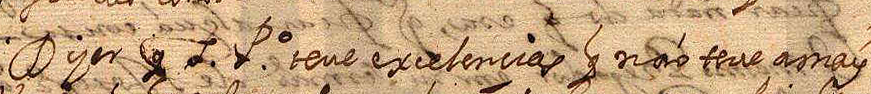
Dizer q̄ S. P.o teue excelencias q̄ naõ teue a maỹ
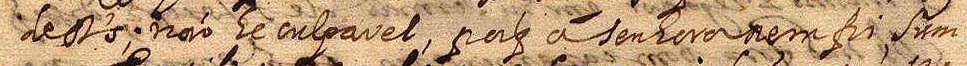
de Ds̄, naõ he culpauel, porq̄ a senhora nem foi Sum
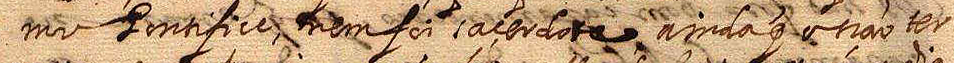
mo Pontifice, nem foi sacerdote ainda q̄ o naõ ter
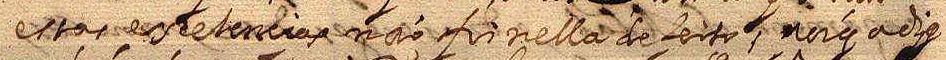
estas excelencias naõ foi nella defeito, aos q̄ a dig
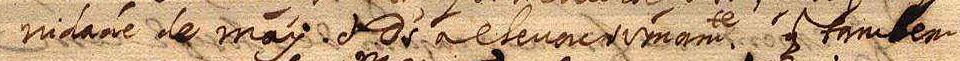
nidade de maỹ d Ds̄ a eleuou sum̄amte q̄ tambem
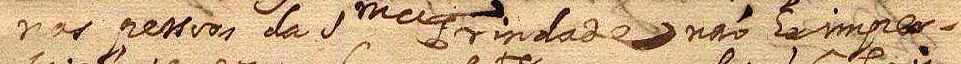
nas pessoas da Sma Trindade naõ he imper
